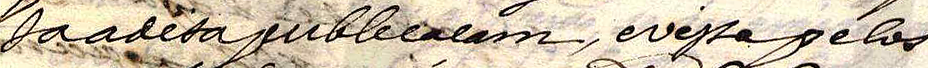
ta a dita publicaçam, e vista pelos
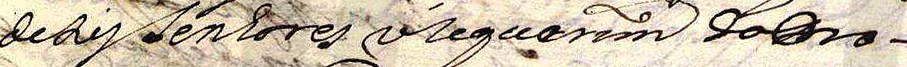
ditos senhores o Requerimto do Pro
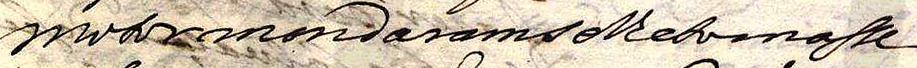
motor mandaramselhe tornasse
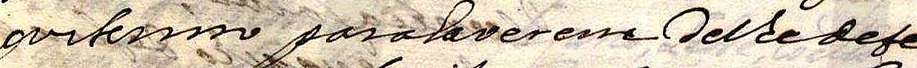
por termo para haverem de lhe defe
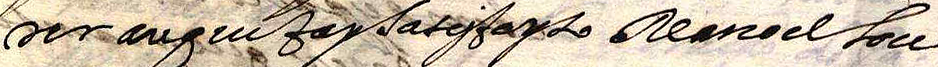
rer ao que foy satisfeyto Manoel Lou
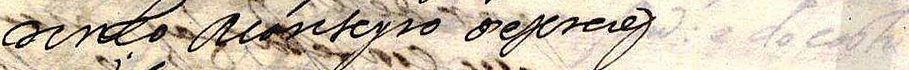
renço Monteyro o escrevy
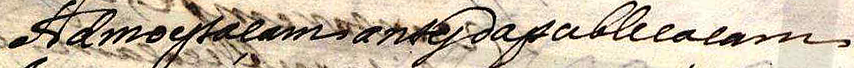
Admoestaçam antes da publicaçam
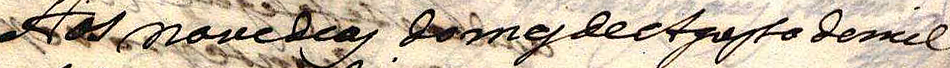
Aos noue dias do mes de Agosto de mil
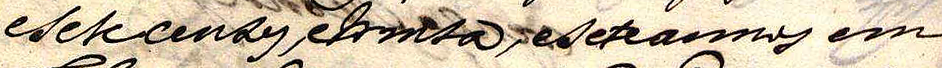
e setecentos, e trinta, e sete annos em
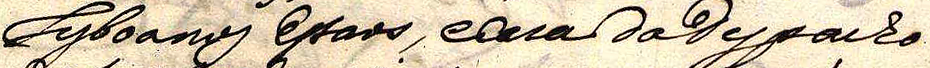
Lisboa nos Estaos, e caza do despacho
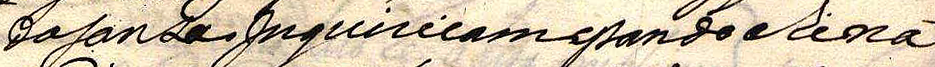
da santa Jnquiziçam estando ahi na
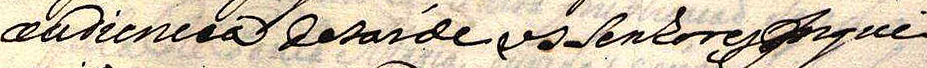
audiencia de tarde os senhores Jnqui
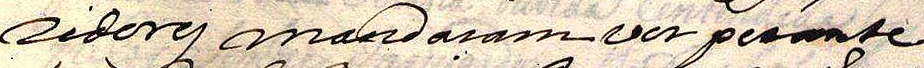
zidores mandaram vir perante
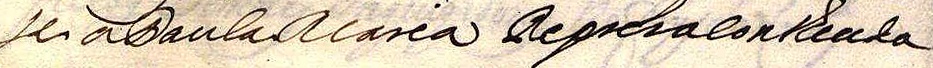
si a Paula Maria Re preza contheuda
